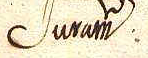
Iuramto.
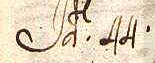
Id̄e. 44.
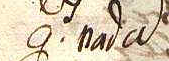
ges. nada
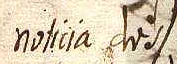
noticia do R.
